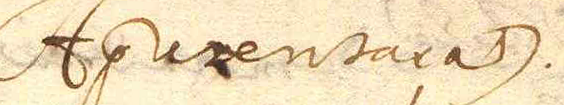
Apresentaçaõ.
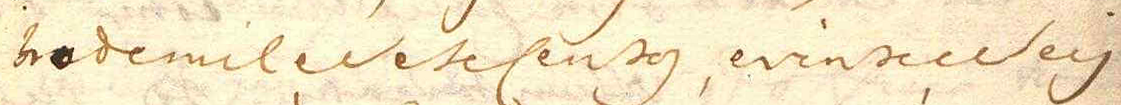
bro de mil, e seteCentos, e vinte, e seis
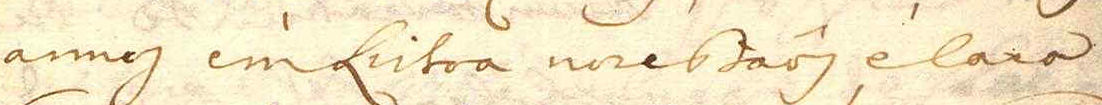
annos em Lisboa nos estaós, e caza
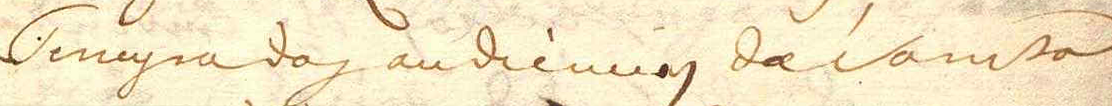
Terceyra das audiencias da sancta
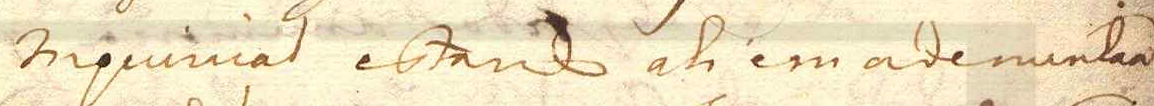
Inquiziçaõ estando ahi em a de manhaã
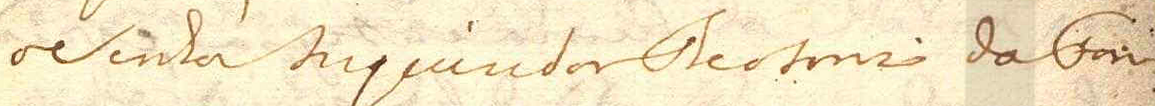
o Senhor Inquisidor Theotonio da Fon
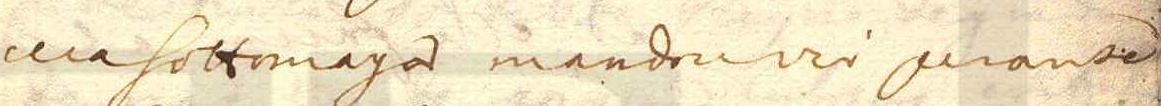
ceca sottomayor mandou vir perante
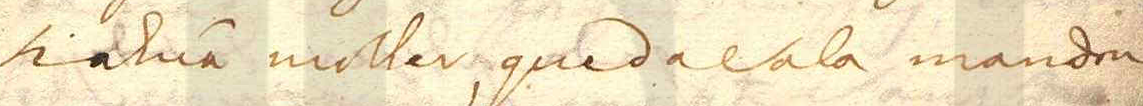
si a huā mulher, que da sala mandou
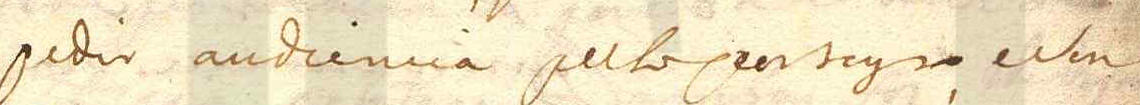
pedir audiencia pello porteyro, e sen
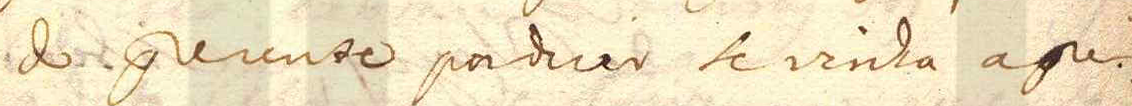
do prezente por dizer se vinha apre
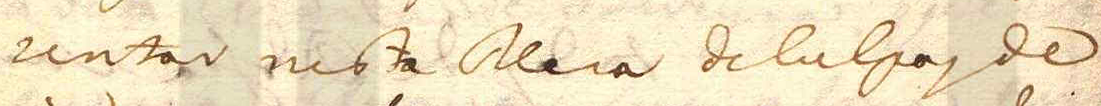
zentar nesta Meza de Culpas de
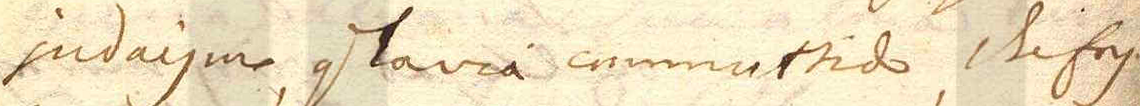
judaismo, q̄ havia commettido, lhe foy
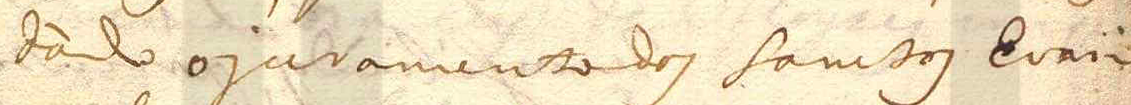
dàdo o juramento dos santos Evan
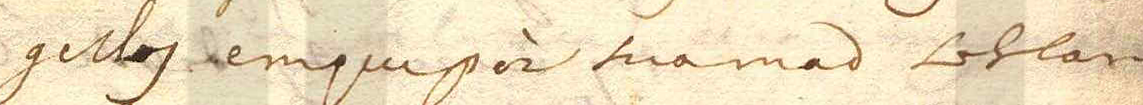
gelhos em que pós sua maõ sob car
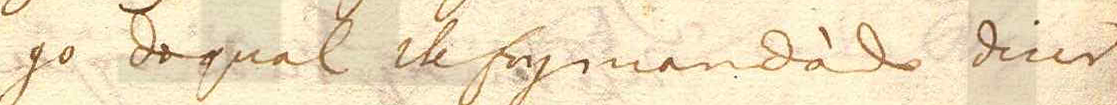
go do qual lhe foy mandàdo dizer
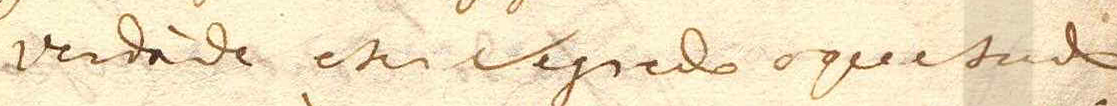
verdade e ter segredo e que tudo
